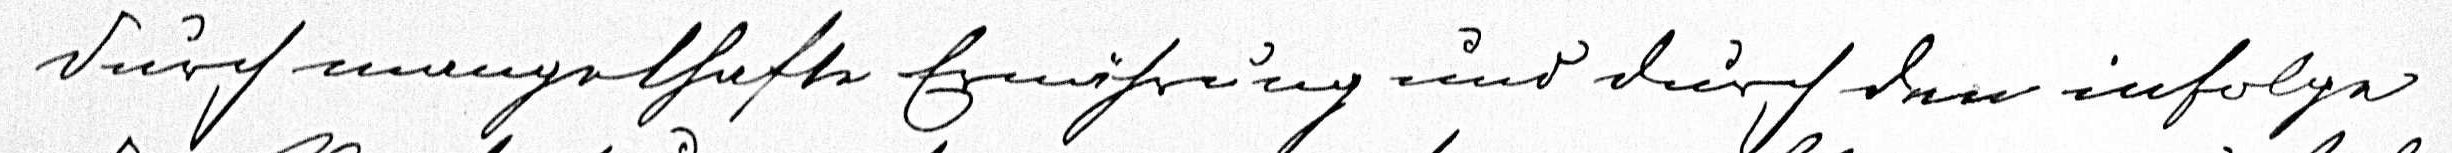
durch mangelhafte Ernährung und durch den infolge
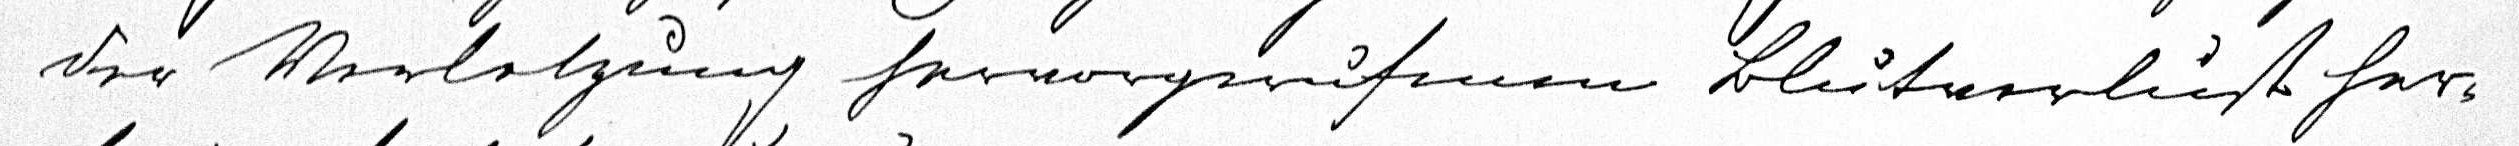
die Verletzung hervorgerufenen Blutverlust her¬
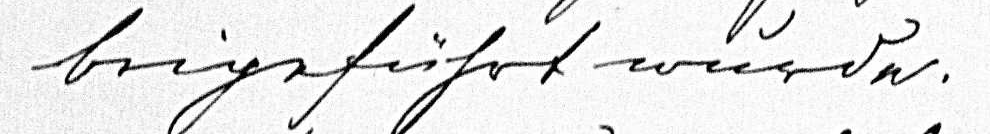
beigeführt wurde.
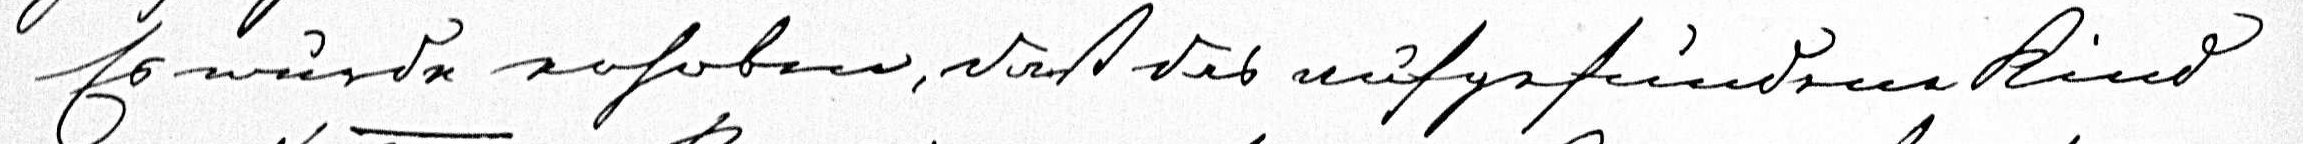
Es wurde erhoben, daß das aufgefundene Kind
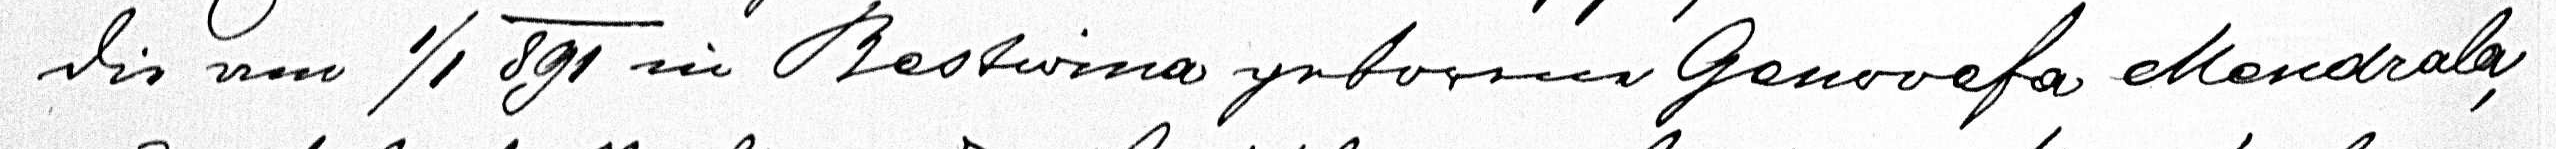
die am 1/1 1891 in Bostwina geborene Genovefa Mendrala
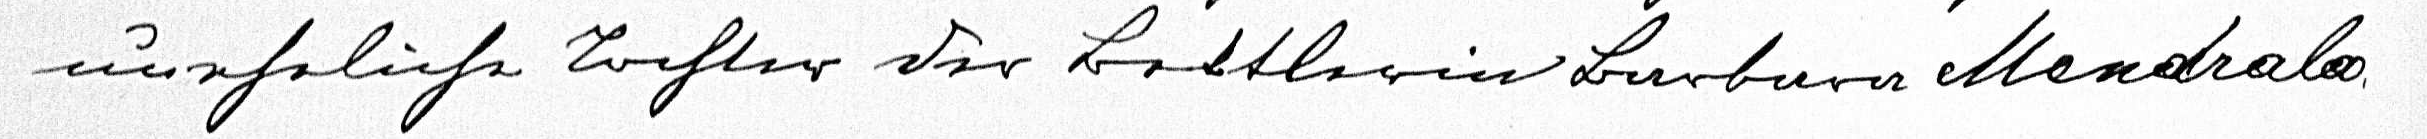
uneheliche Tochter der Bettlerin Barbara Mendrala
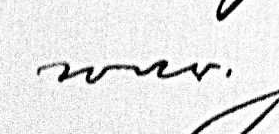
war.
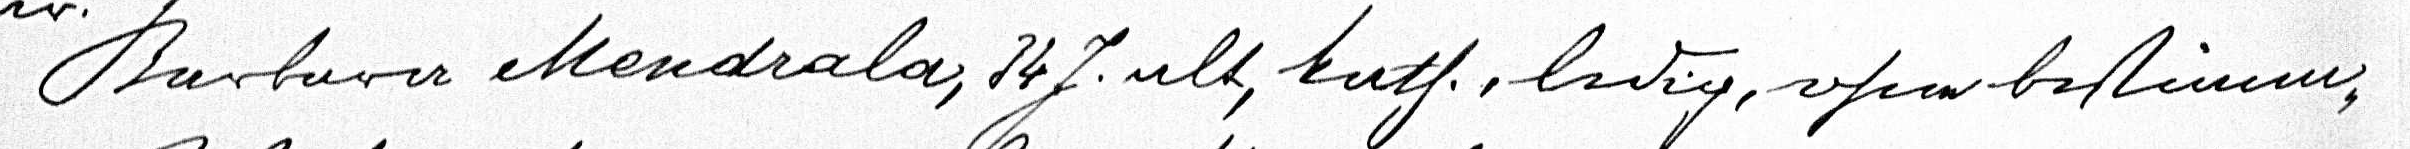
Barbara Mendrala, 34 J. alt, kath., ledig, ohne bestimm¬
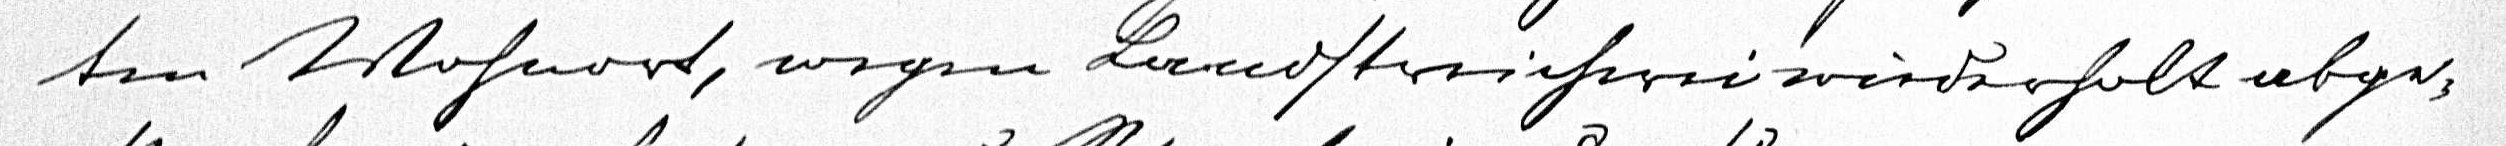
ten Wohnort, wegen Landstreicherei wiederholt abge¬
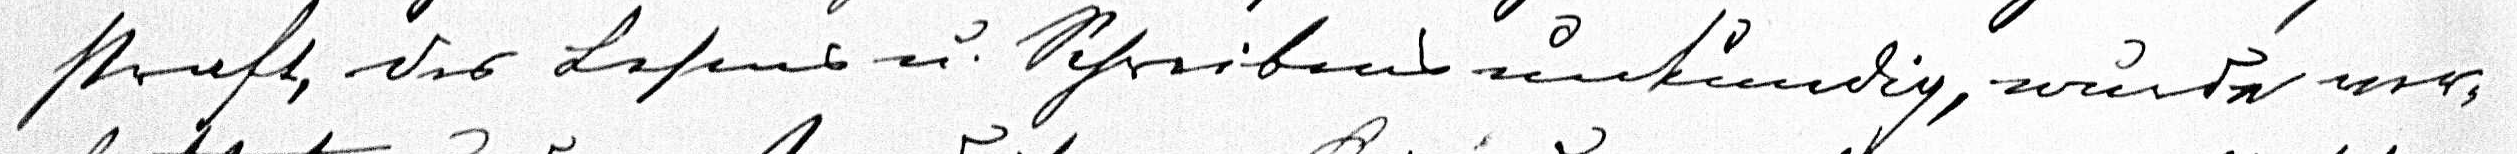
straft, des Lesens u Schreibens unkundig, wurde ver¬
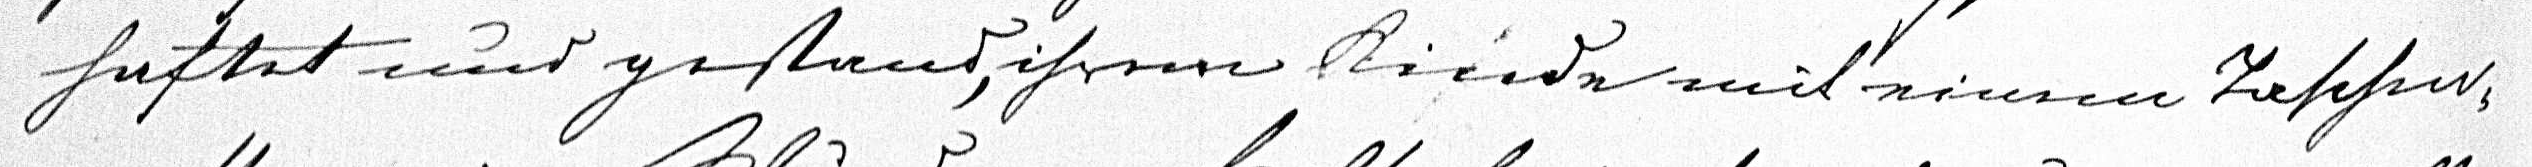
haftet und gestand, ihrem Kinde mit einem Taschen¬
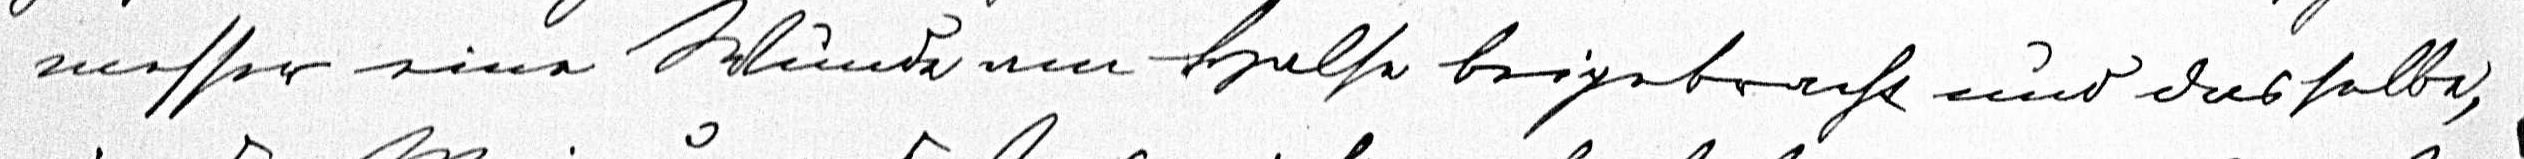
messer eine Wunde am Halse beigebracht und dasselbe,
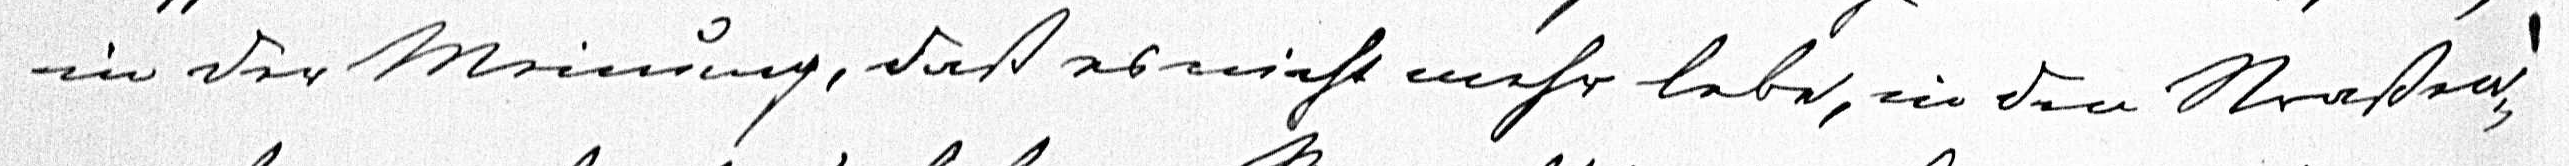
in der Meinung, daß es nicht mehr lebe, in den Straßen¬
